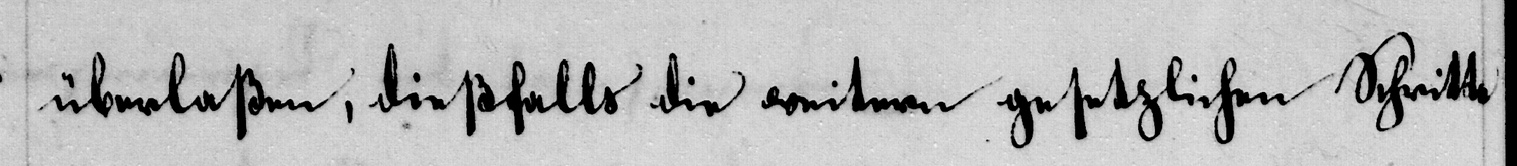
überlaßen, dießfalls die weiteren gesetzlichen Schritte
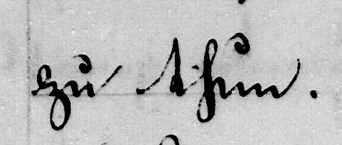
zu thun.
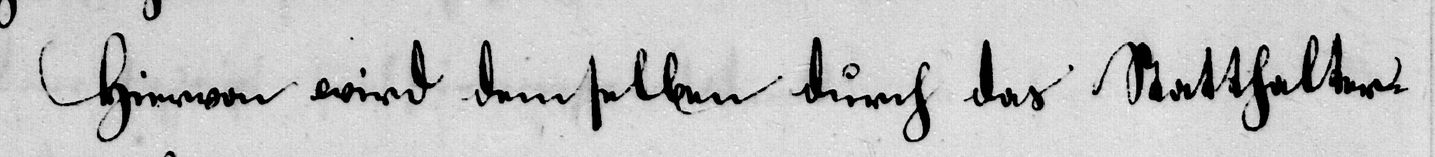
Hiervon wird demselben durch das Statthalter¬
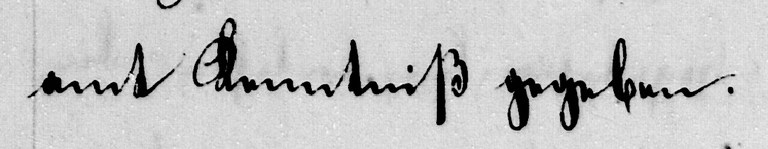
amt Kenntniß gegeben.
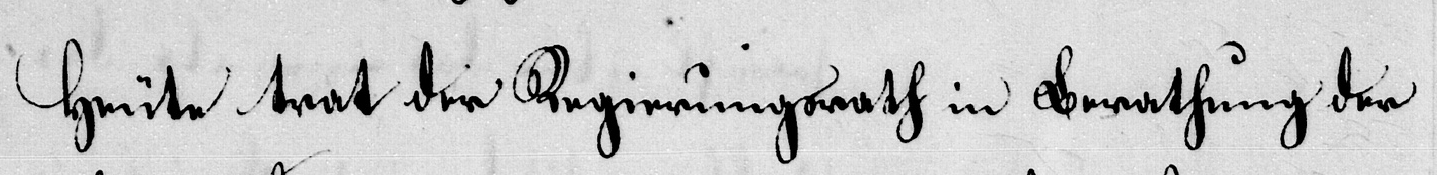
Heute trat der Regierungsrath in Berathung der
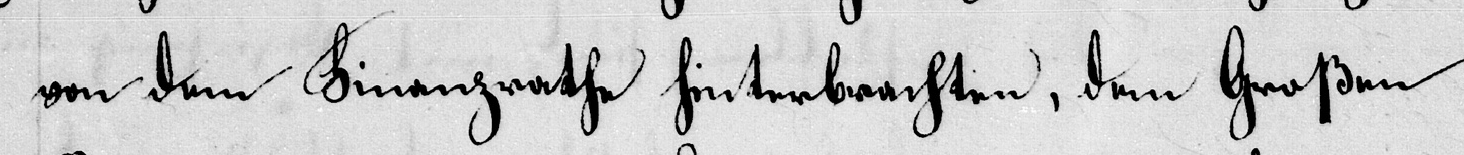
von dem Finanzrathe hinterbrachten, dem Großen
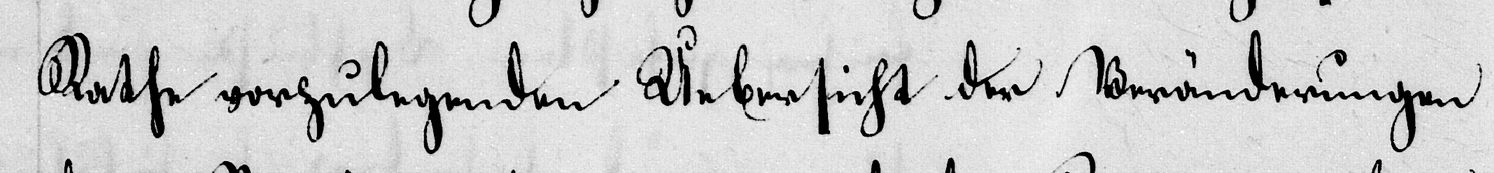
Rathe vorzulegenden Uebersicht der Veränderungen
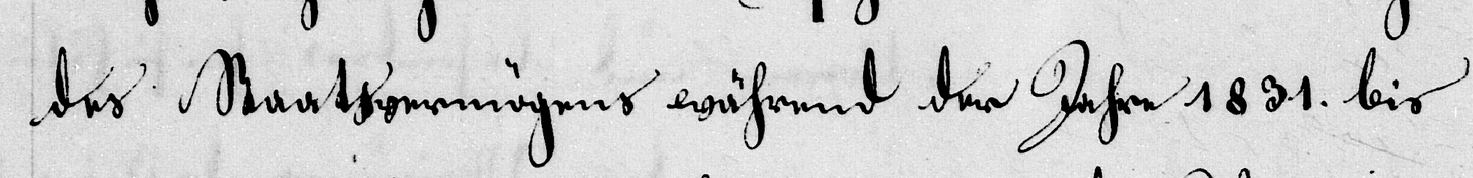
des Staatsvermögens während der Jahre 1831. bis
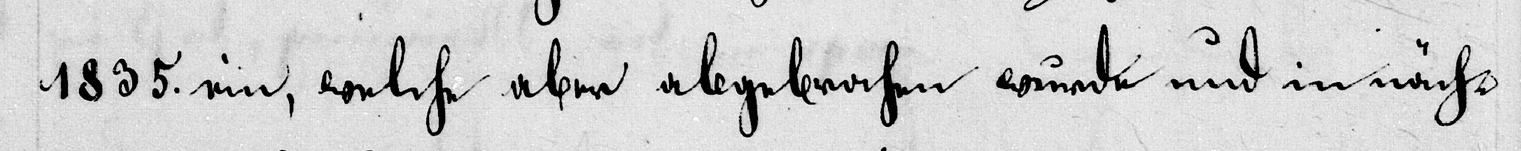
1835. ein, welche aber abgebrochen wurde und in näch¬
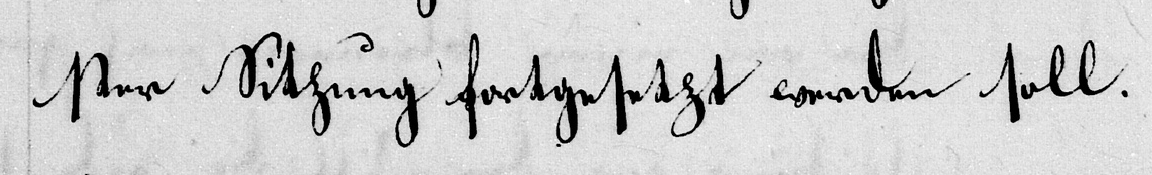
ster Sitzung fortgesetzt werden soll.
